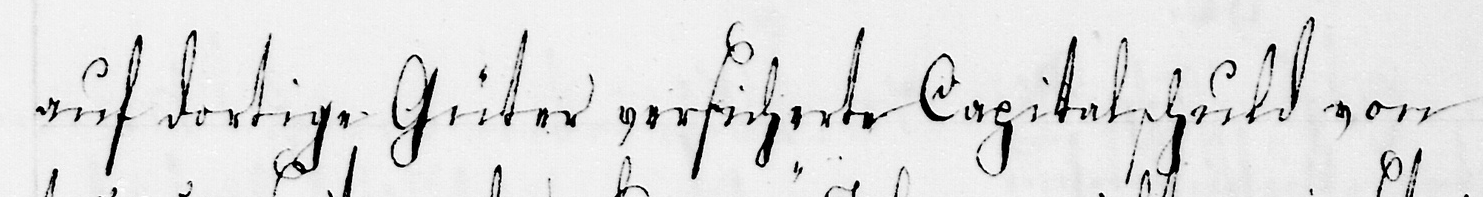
auf dortige Güter versicherte Capitalschuld von
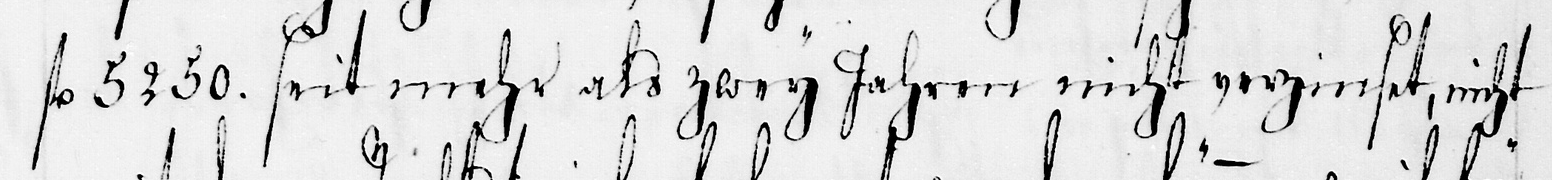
fl. 5250. seit mehr als zwey Jahren nicht verzinset, nicht
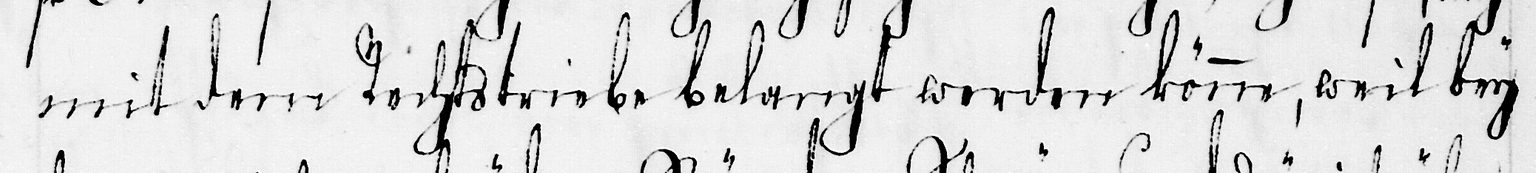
mit dem Rechtstriebe belangt werden könne, weil bey
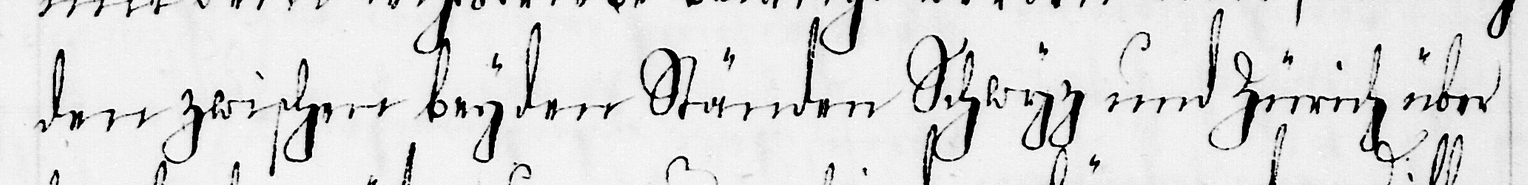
den zwischen beyden Ständen Schwyz und Zürich über
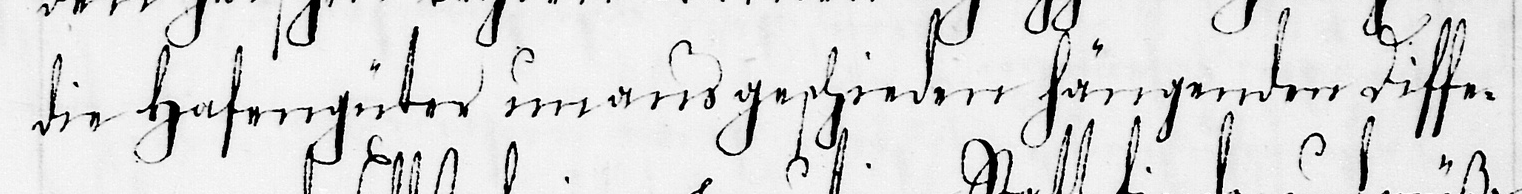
die Hafengüter unausgeschieden hängenden Diffe¬
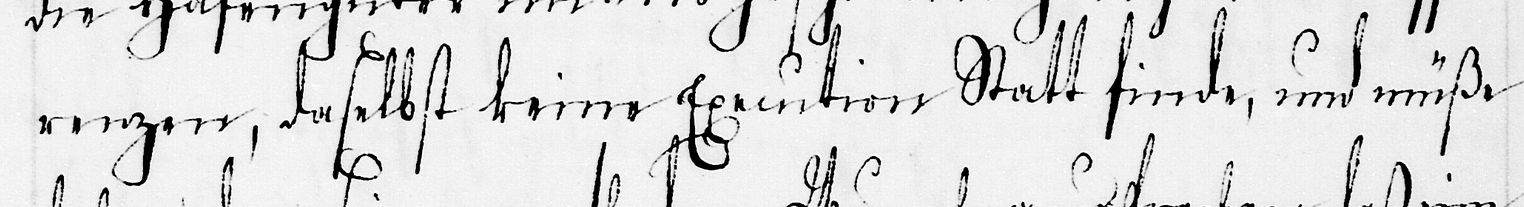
renzen, daselbst keine Execution Statt finde, und müße
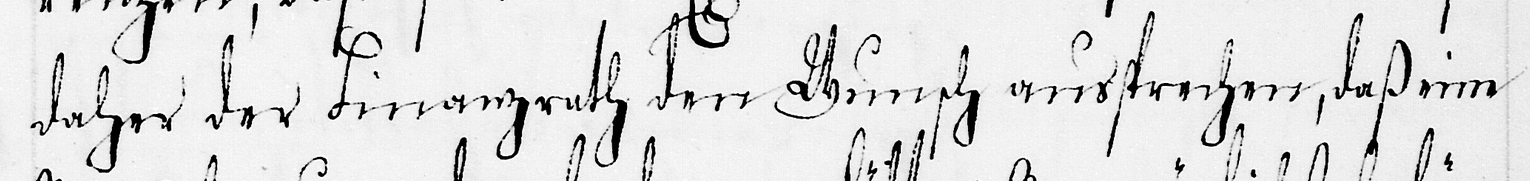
daher der Finanzrath den Wunsch aussprechen, daß eine
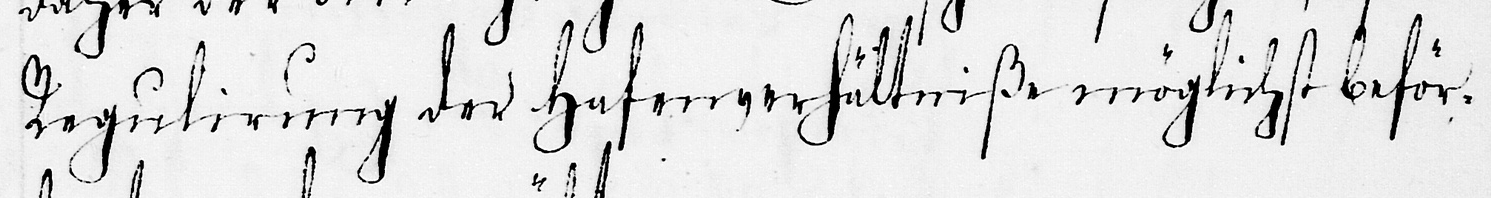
Regulirung der Hafenverhältniße möglichst beför¬
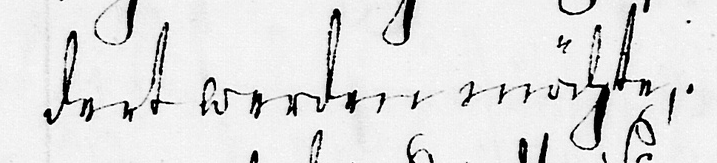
dert werden möchte.
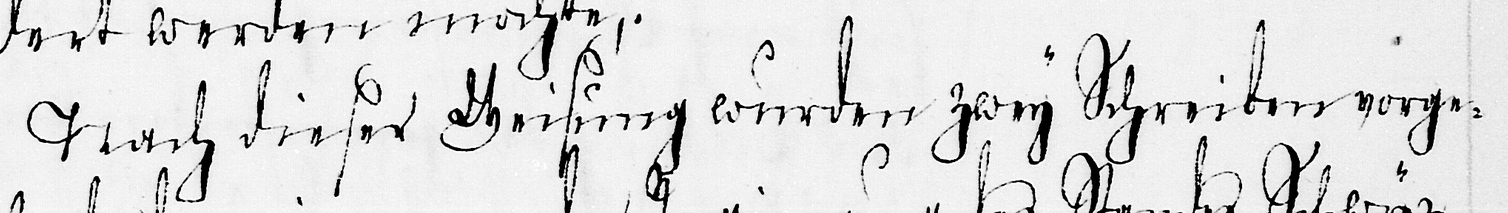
Nach dieser Weisung wurden zwey Schreiben vorge¬
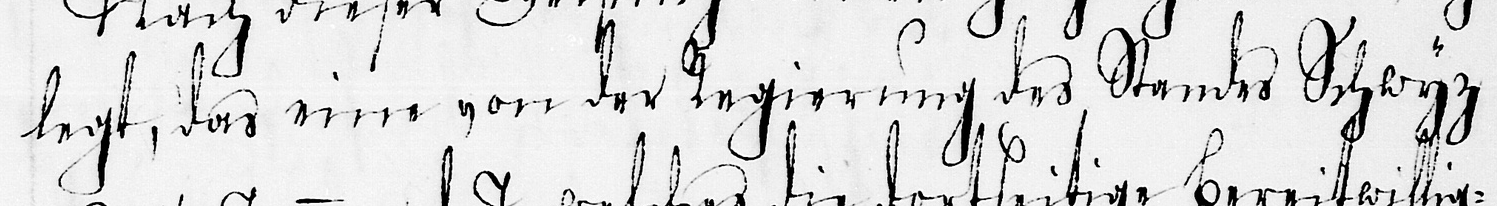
legt, das eine von der Regierung des Standes Schwyz
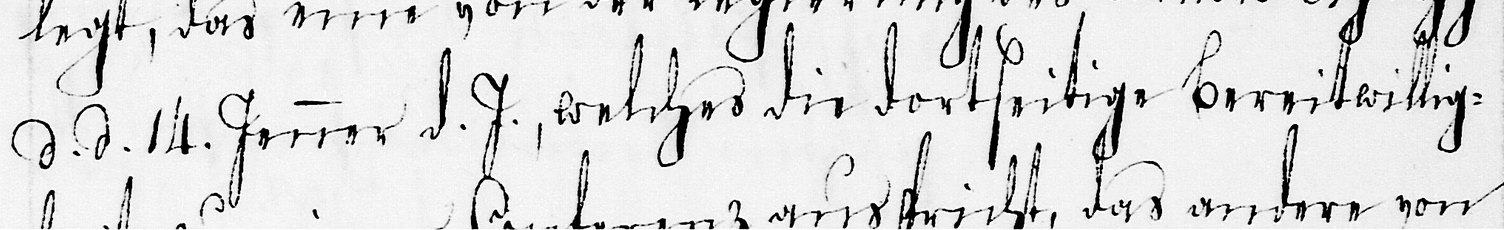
d. d. 14. Jenner d. J., welches die dortseitige Bereitwillig¬
